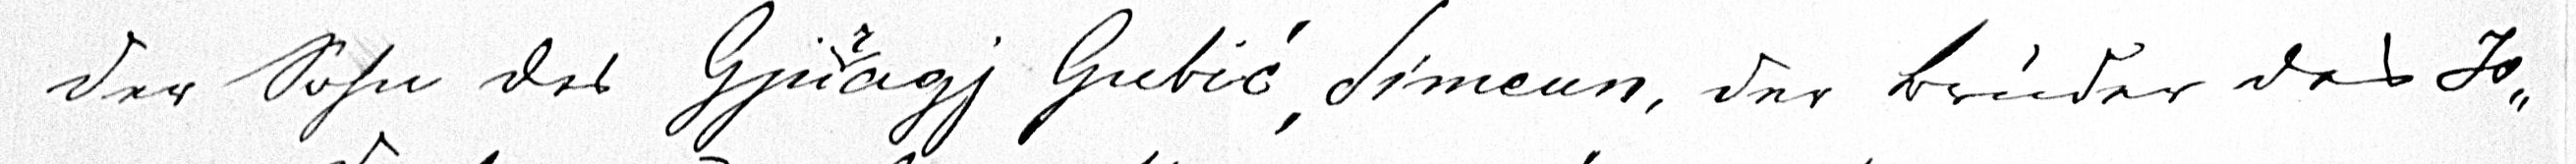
der Sohn des Gjuragj Gubić, Simeun, der Bruder des Jo¬
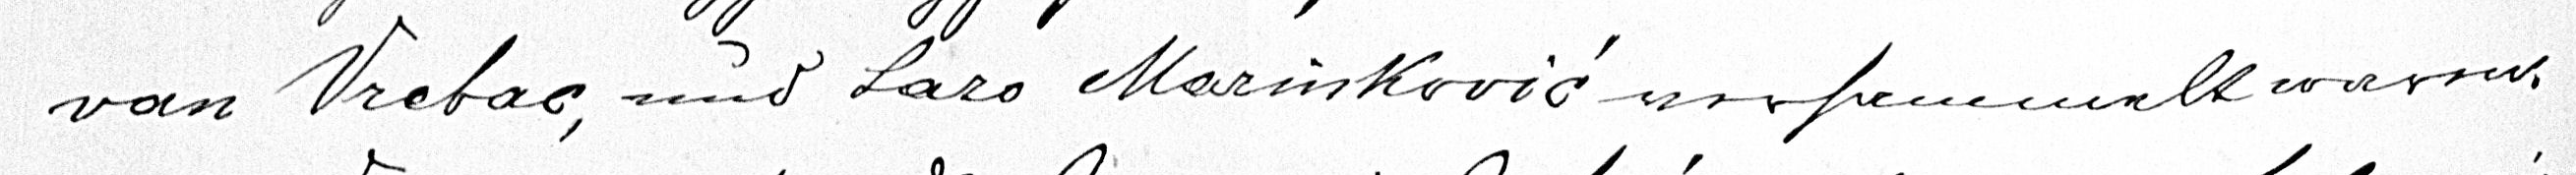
van Vrebac, und Lazo Marinković versammelt waren.
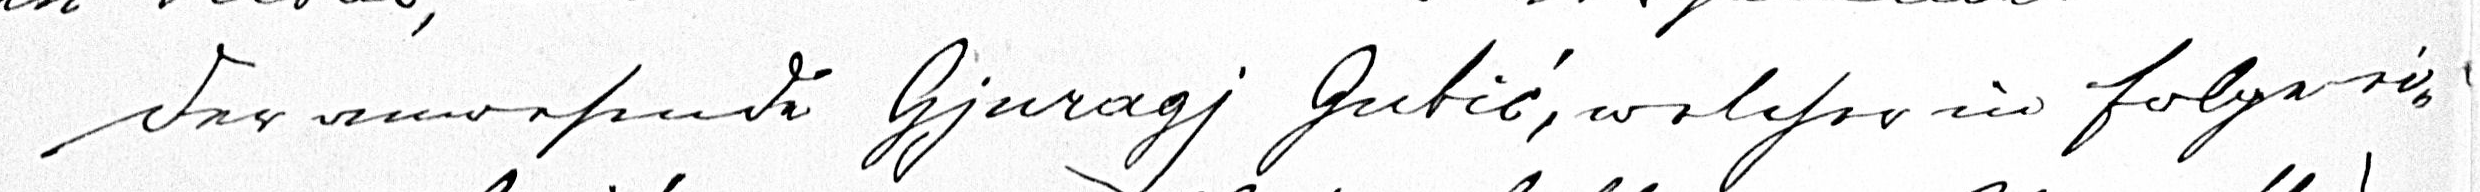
Der anwesende Gjuragj Gubić, welcher in Folge ei¬
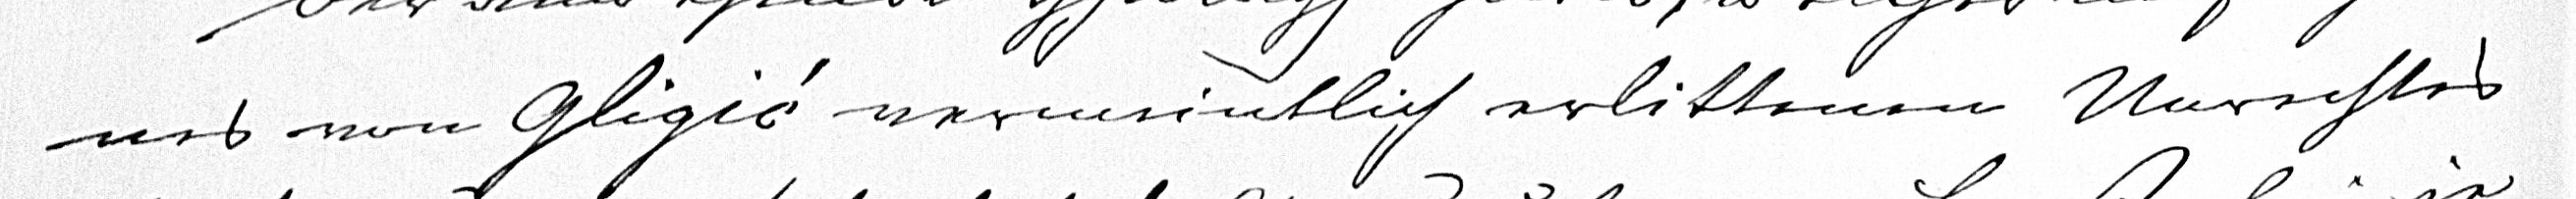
nes von Gligić vermeintlich erlittenen Unrechtes
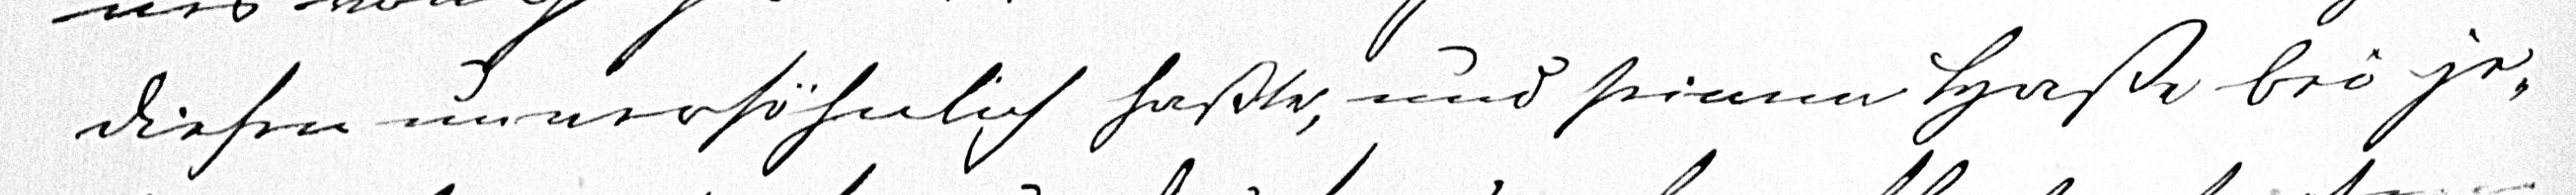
diesen unversöhnlich haßte, und seinen Haße bei je¬
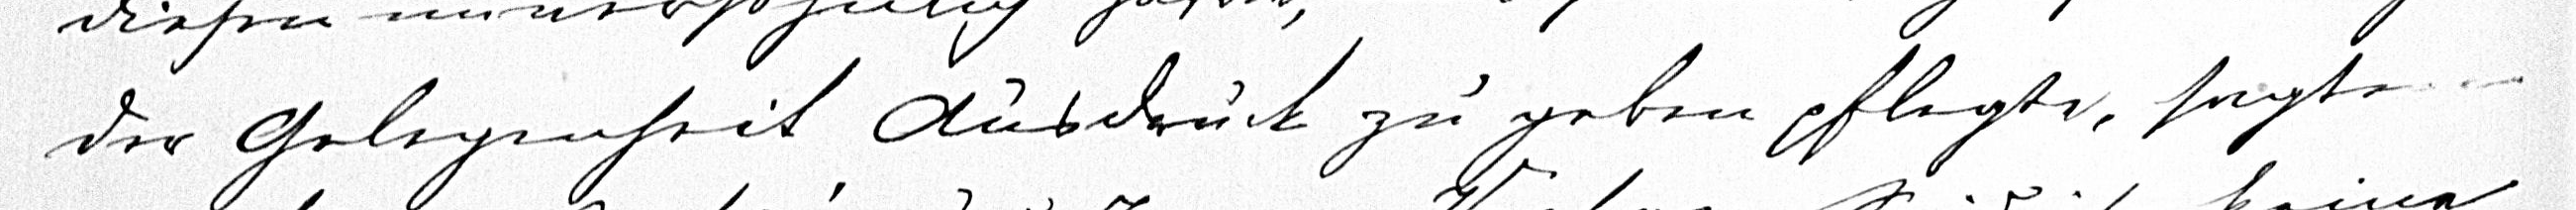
der Gelegenheit Ausdruck zu geben pflegte, sagte
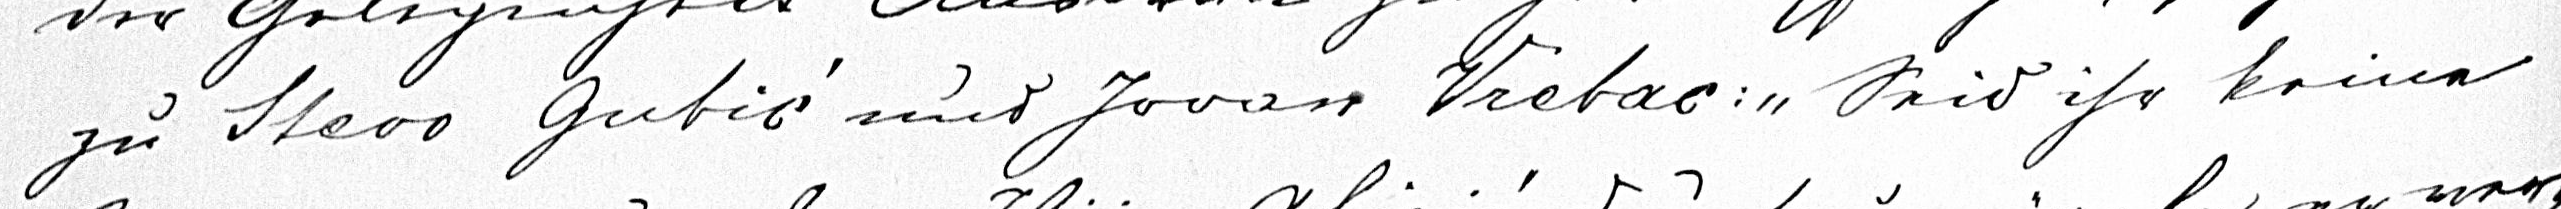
zu Stevo Gubić aus Jovan Vrebac: „Seid ihr keine
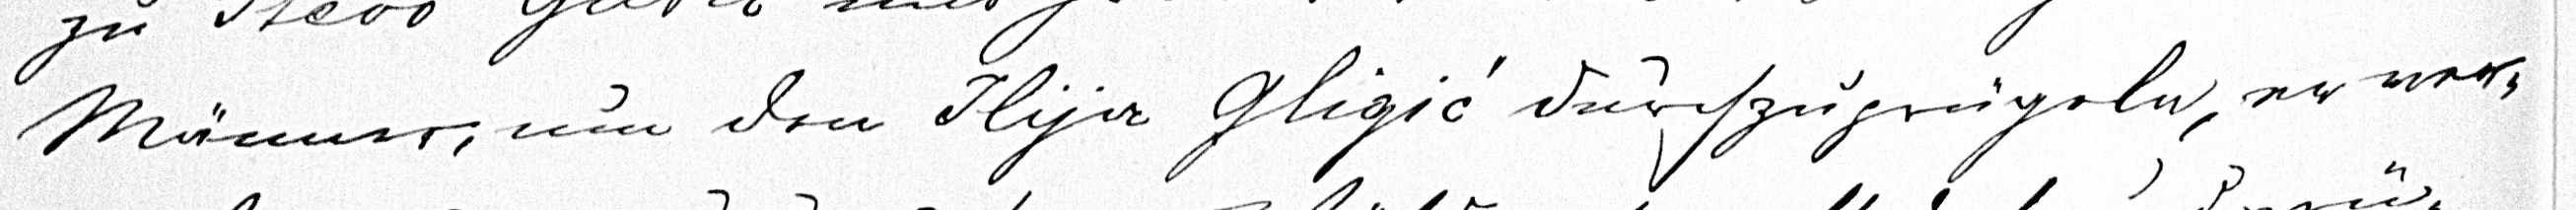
Männer, um den Ilija Gligić durchzuprügeln, er ver¬
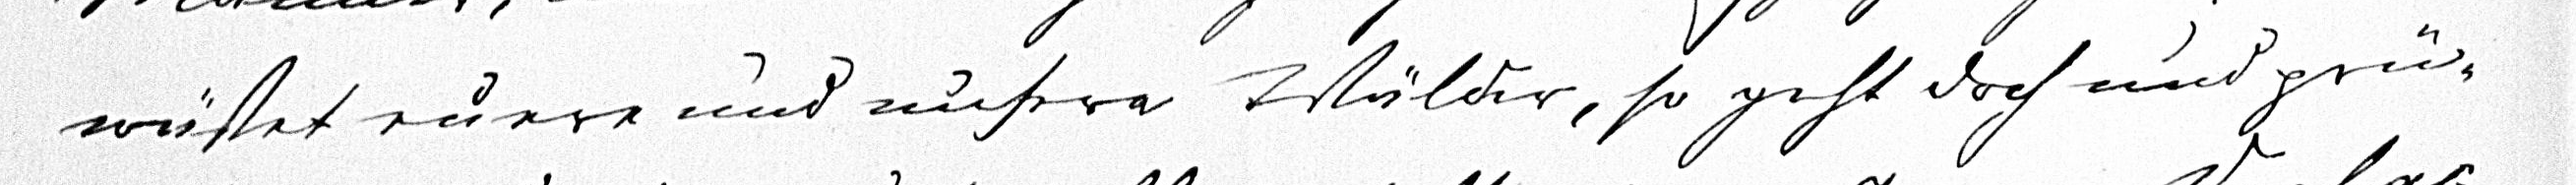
wüstet euere und unsere Wälder, so geht doch und prü¬
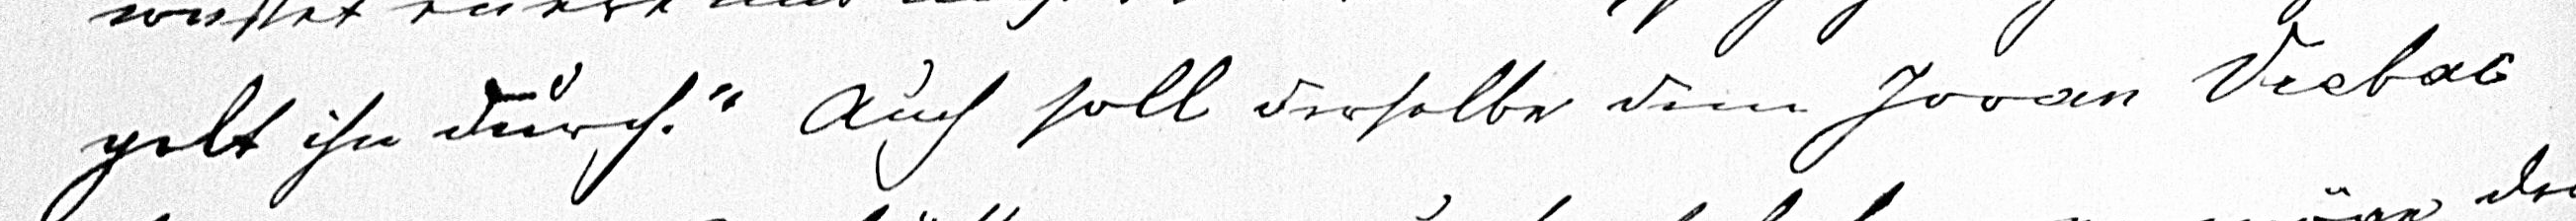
gelt ihn durch.“ Auch soll derselbe dem Jovan Vrebac
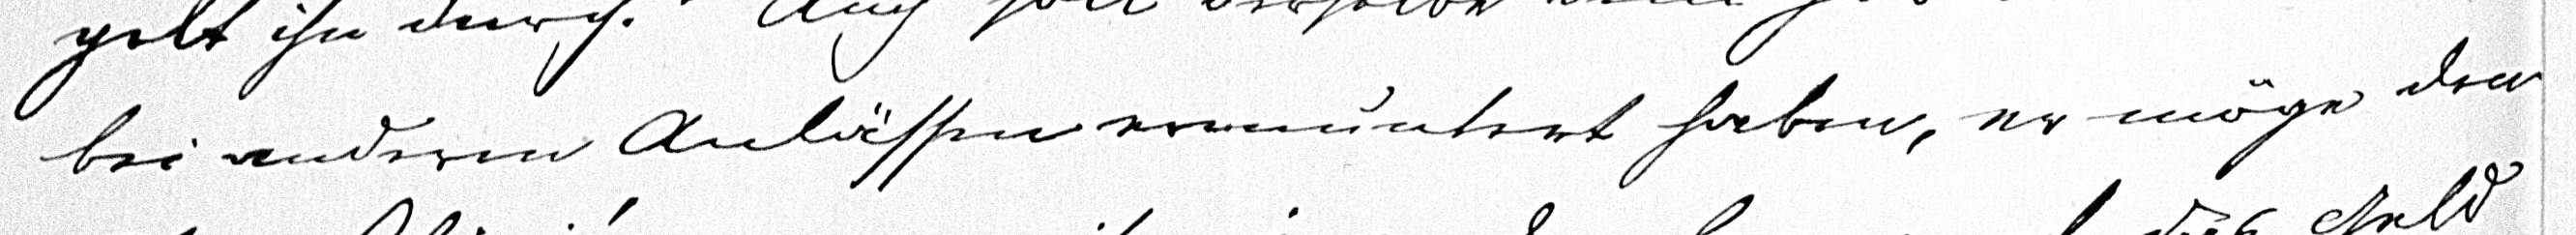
bei anderen Anlässen ermuntert haben, er möge den
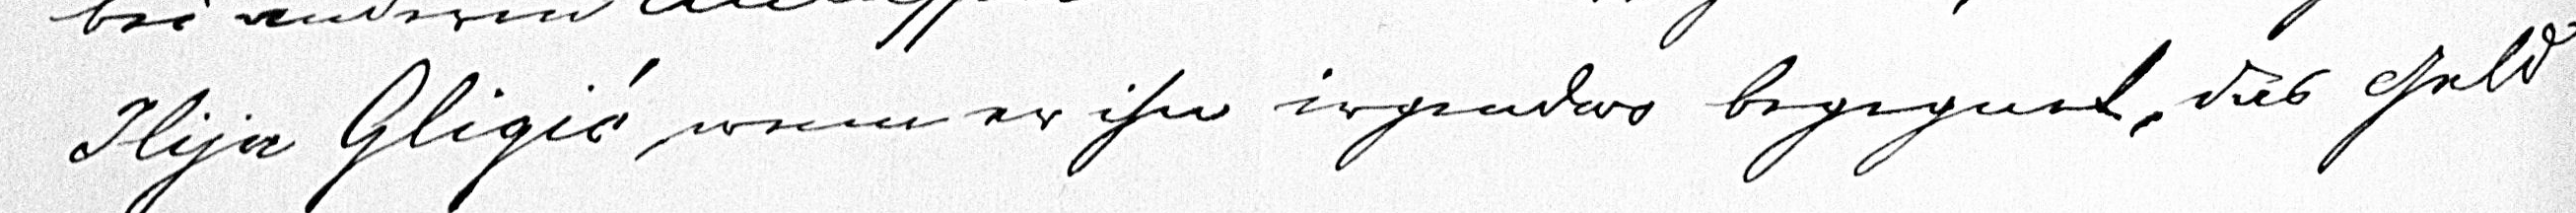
Ilija Gligić wenn er ihn irgendwo begegnet, das Geld
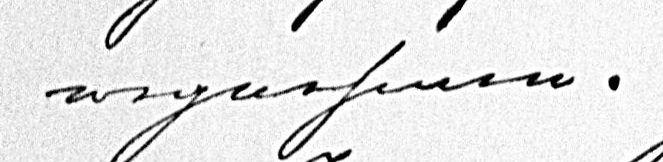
wegnehmen.
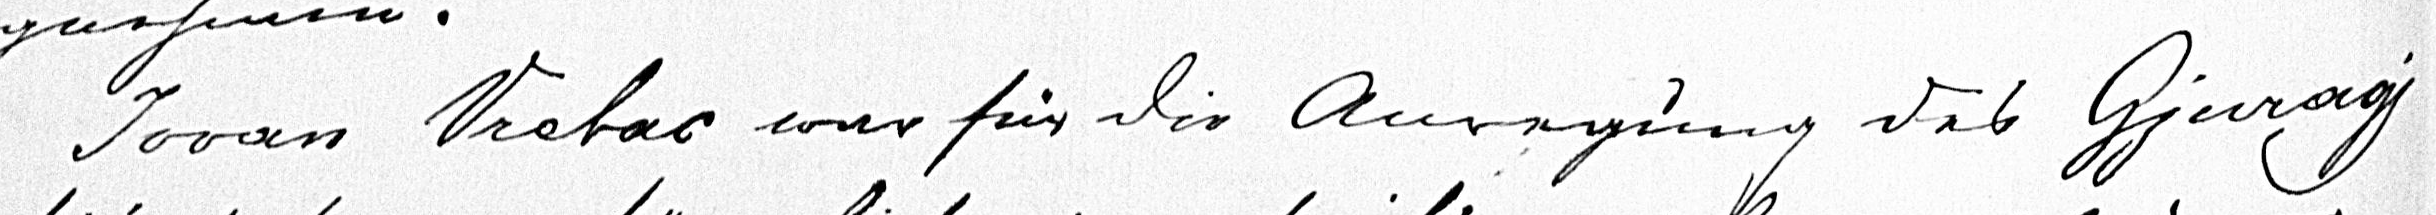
Jovan Vrebac war für die Anregung des Gjuragj
